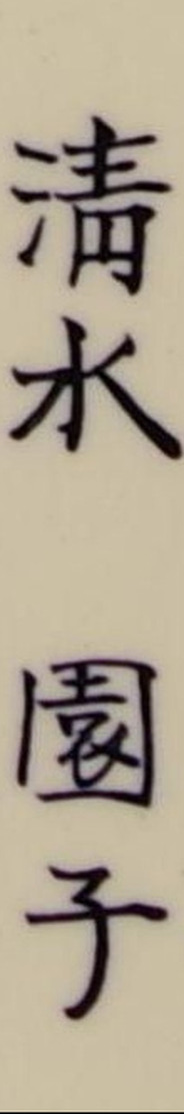清水園子
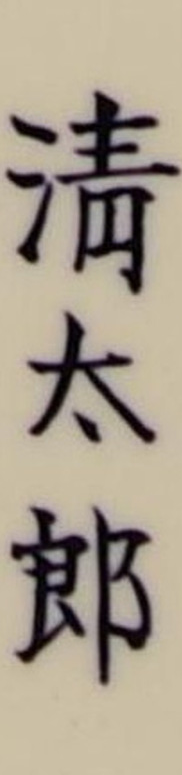清太郎
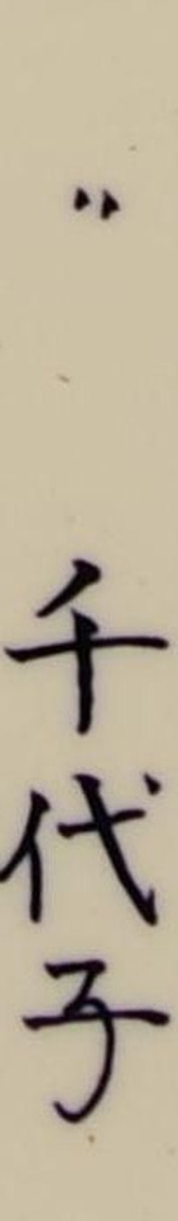千代子
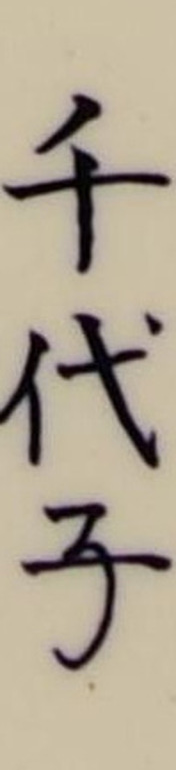千代子
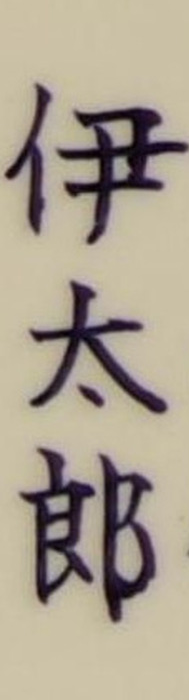伊太郎

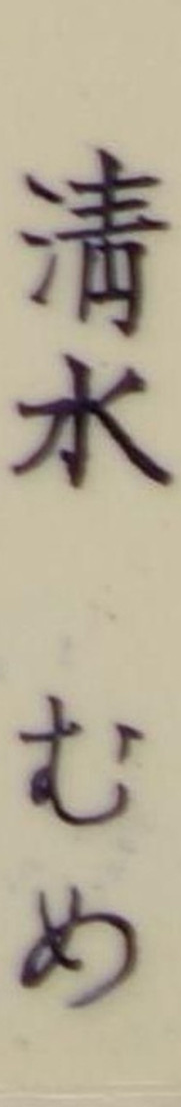清水むめ
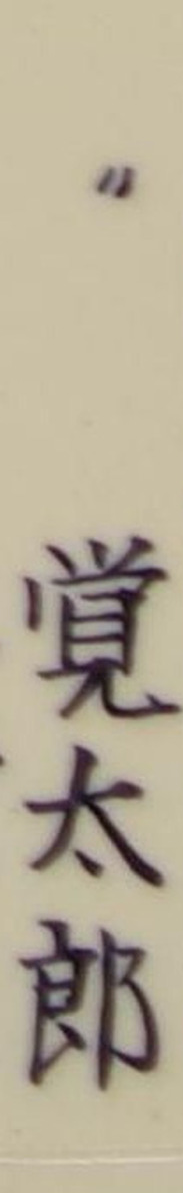覚太郎
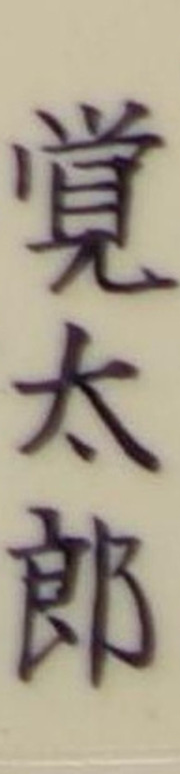覚太郎
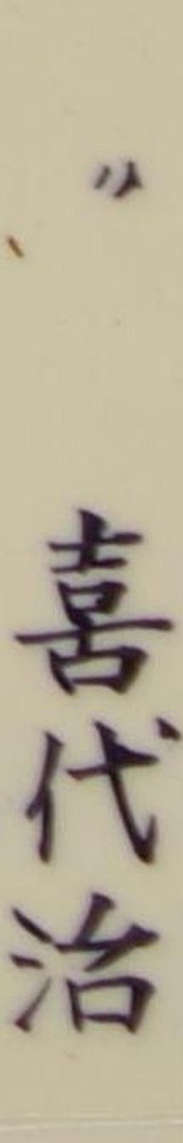喜代治
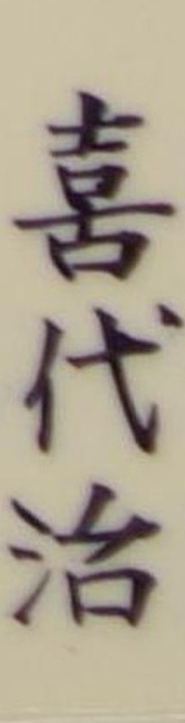喜代治
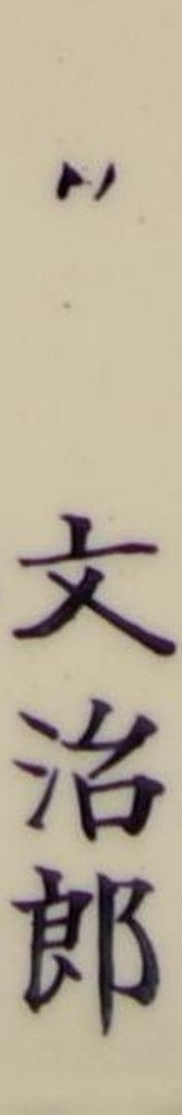文治郎
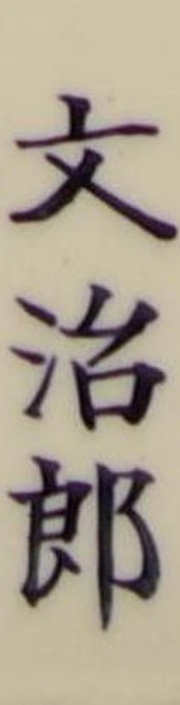文治郎
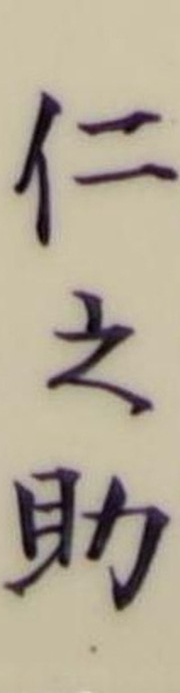仁之助
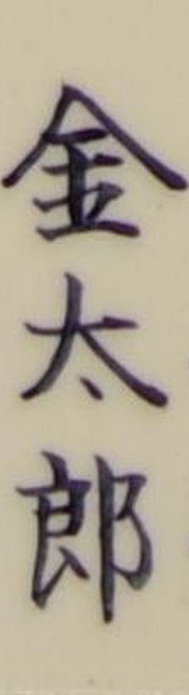金太郎
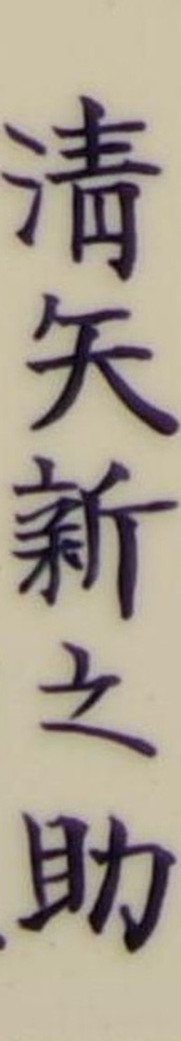清矢新之助

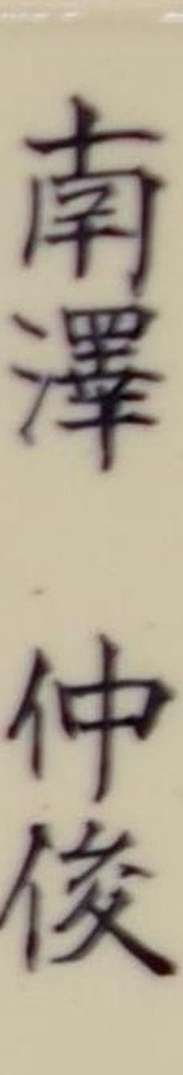南澤仲俊
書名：E~L
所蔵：高野山金剛峯寺
